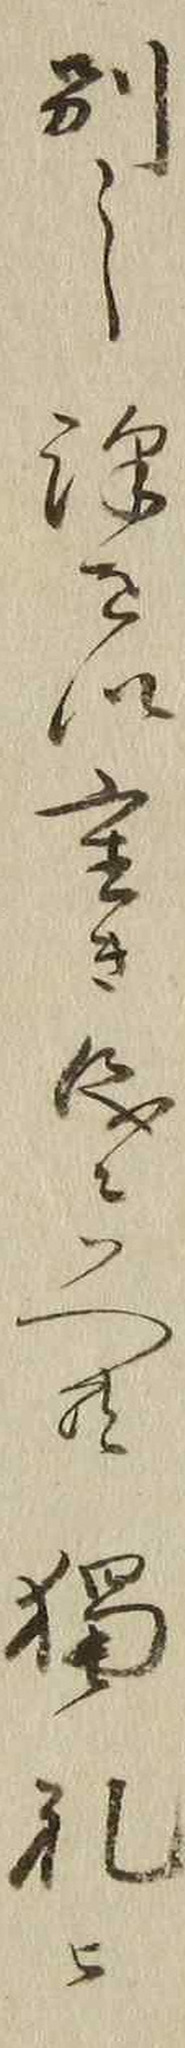別之訳を以重き儀ニ候へ共独礼被
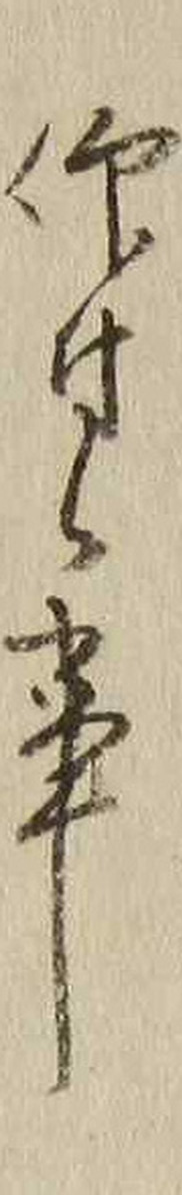仰付候事
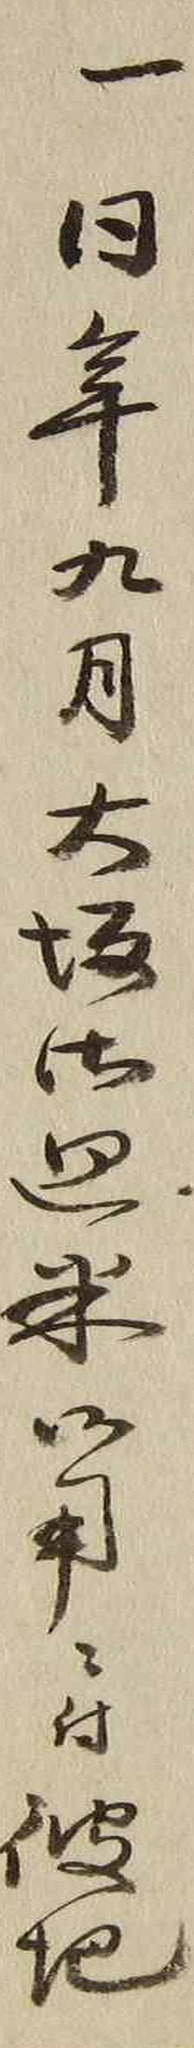一同年九月大坂御廻米御用ニ付彼地
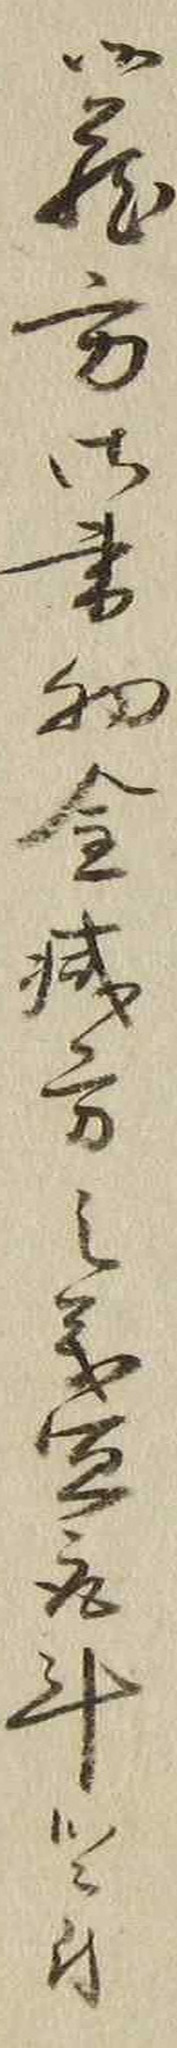御蔵方御書物金減方之義宜取計候ニ付
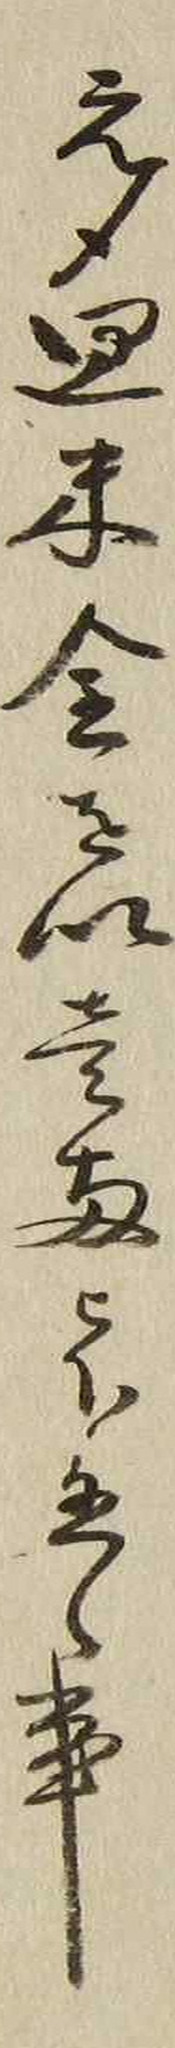元〆廻米金を以壱両被下置候事
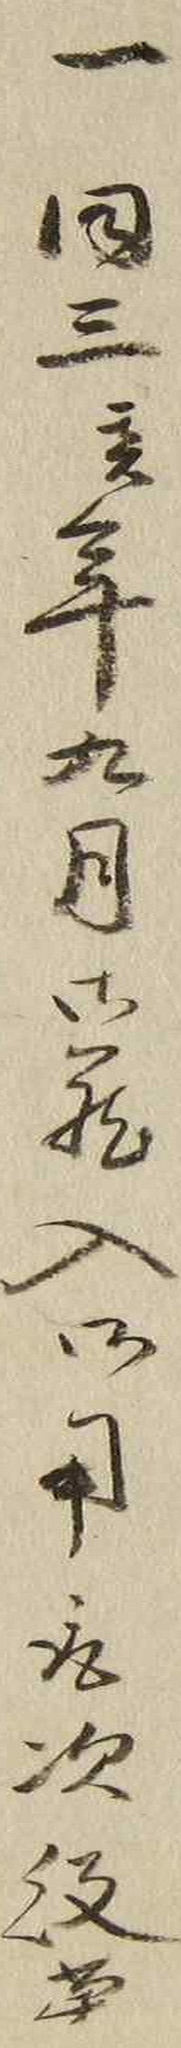一同三亥年九月御蔵入御用取次役当
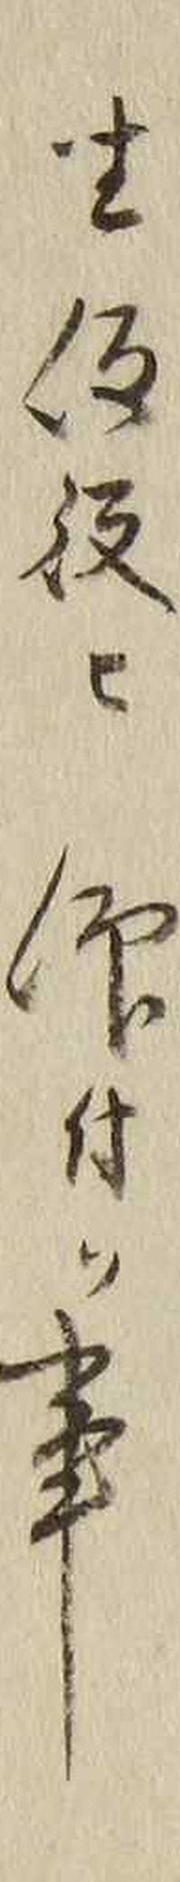坐仮役被仰付候事
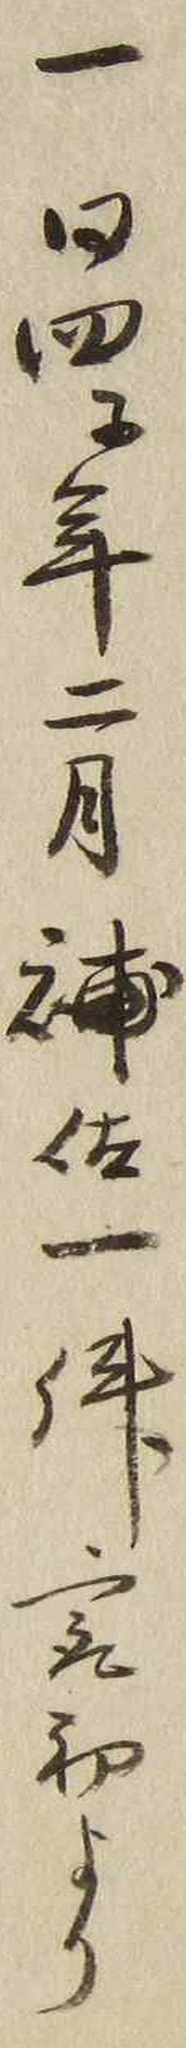一同四子年二月補佐一件最初より

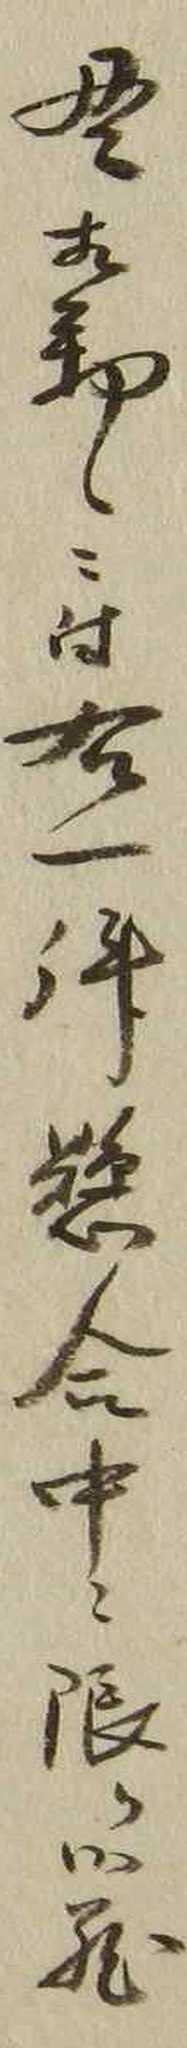貫相勤候ニ付右一件懸合中ニ限り御蔵
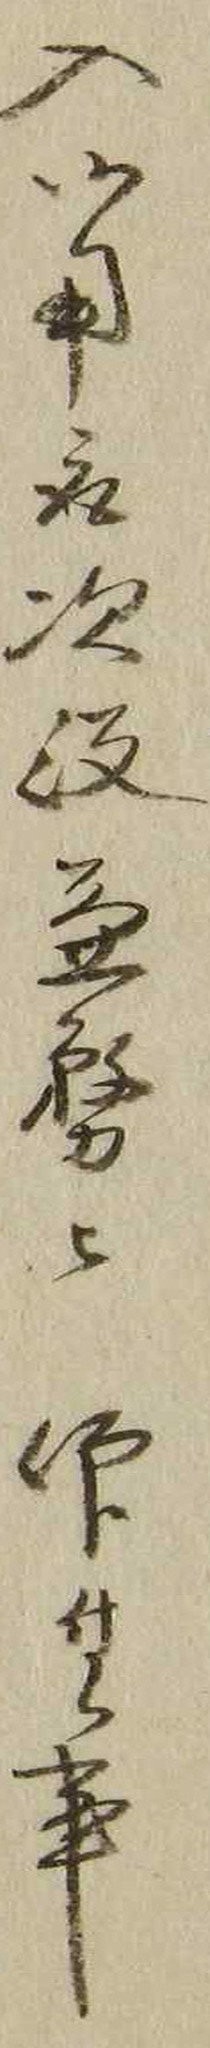入御用取次役兼務被仰付候事
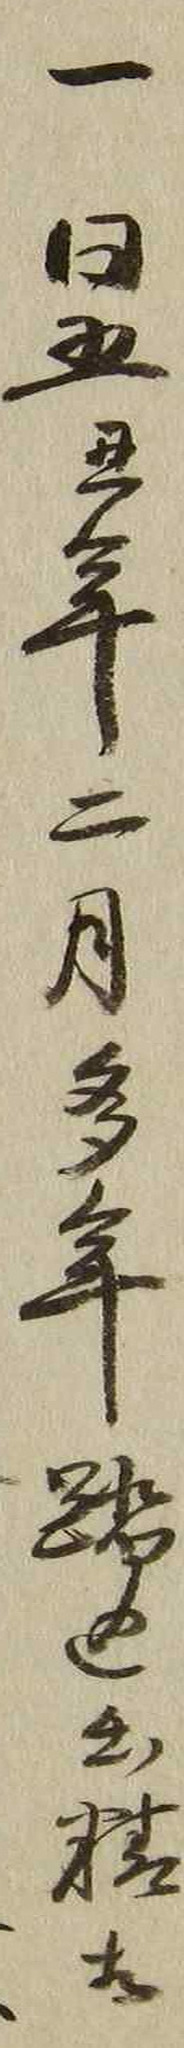一同五丑年二月多年踏込出精相
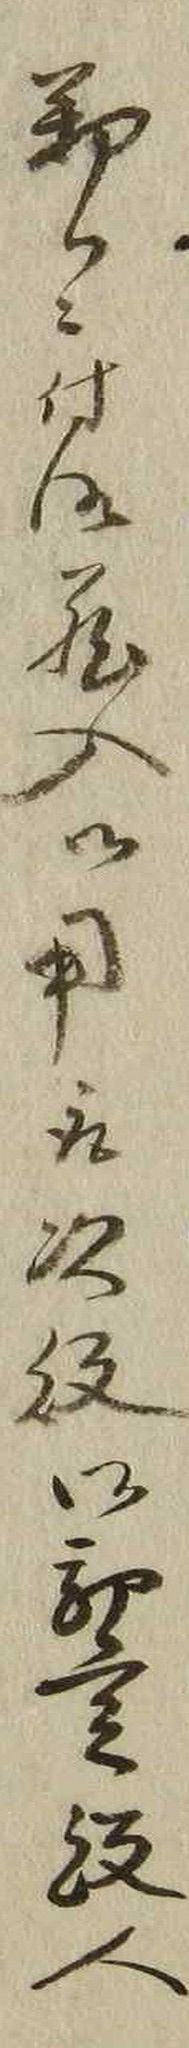勤候ニ付御蔵入御用取次役御勘定役人
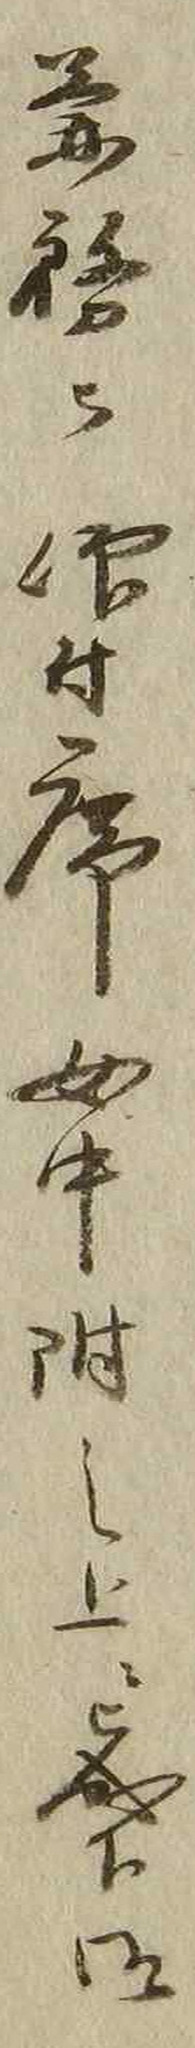兼務被仰付席女中附之上ニ被成下御
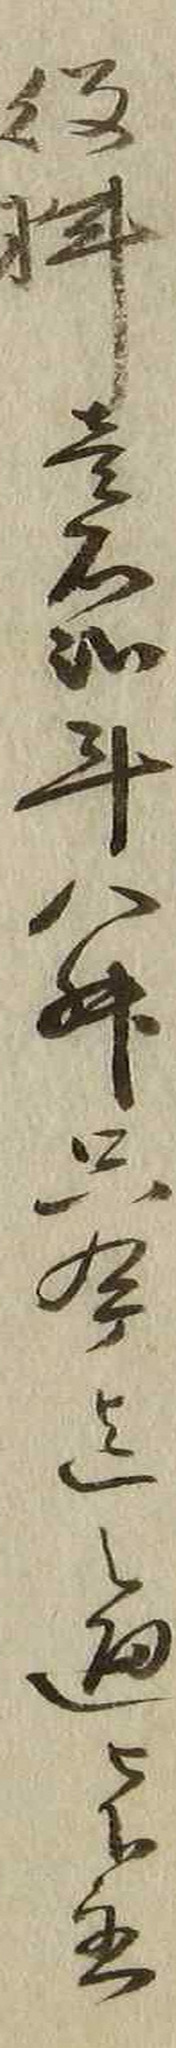役料壱石弐斗八升只今迄之通被下置
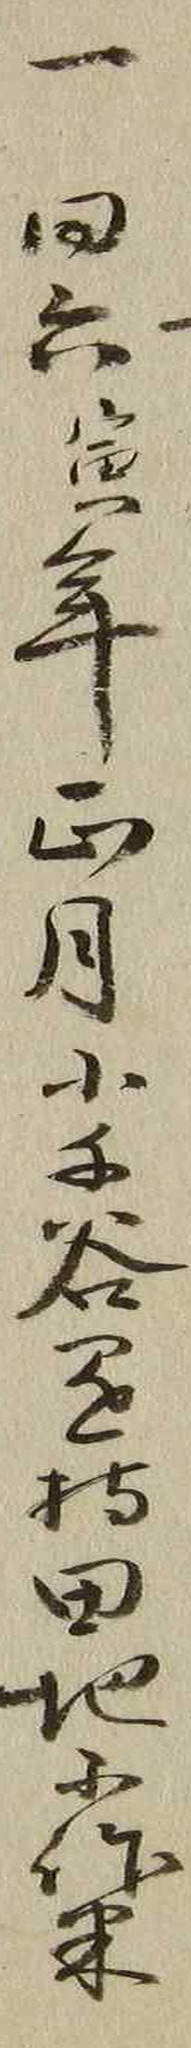一同六寅年正月小千谷懸持田地小作米
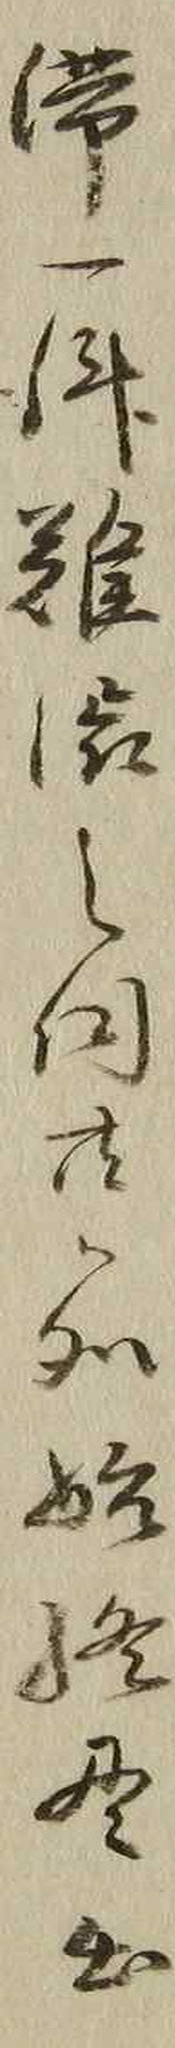滞一件難渋之伺共候処始終貫出
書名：諸士系譜　巻之236　ふ之部4
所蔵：会津若松市立会津図書館
